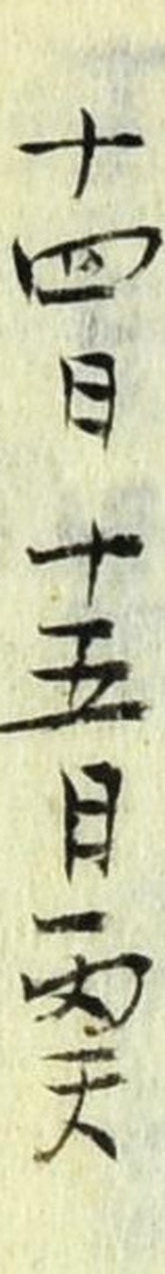十四日十五日雨天
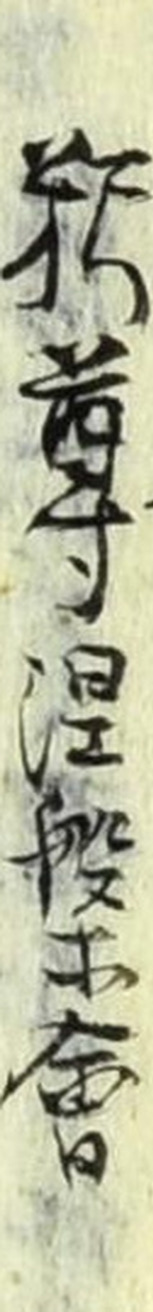釈尊涅槃会
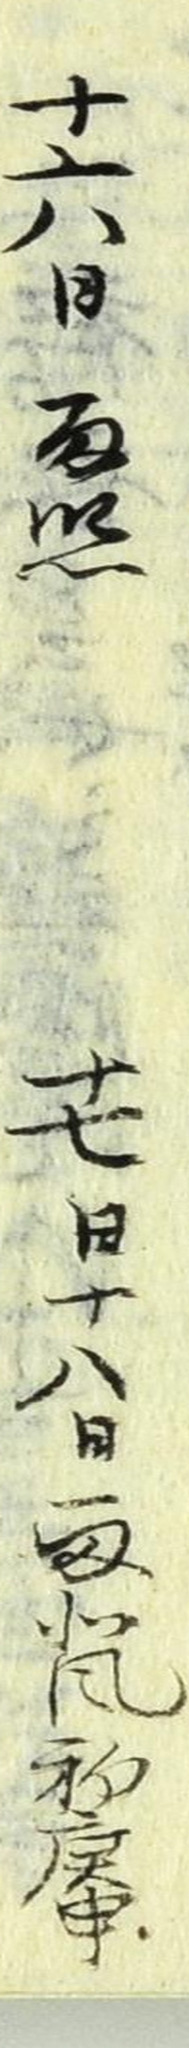十六日雨照十七日十八日雨北風初庚申
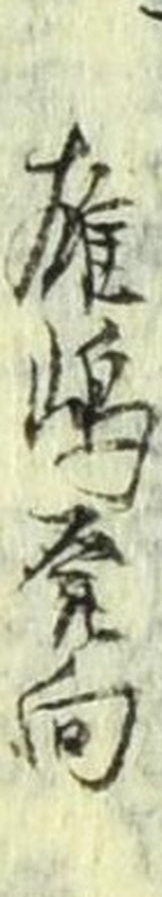雄島発向
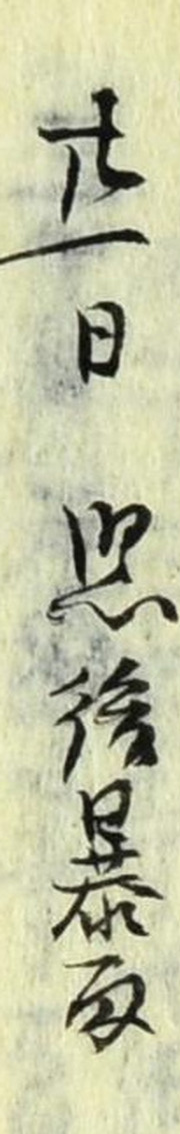廿一日照後暴雨
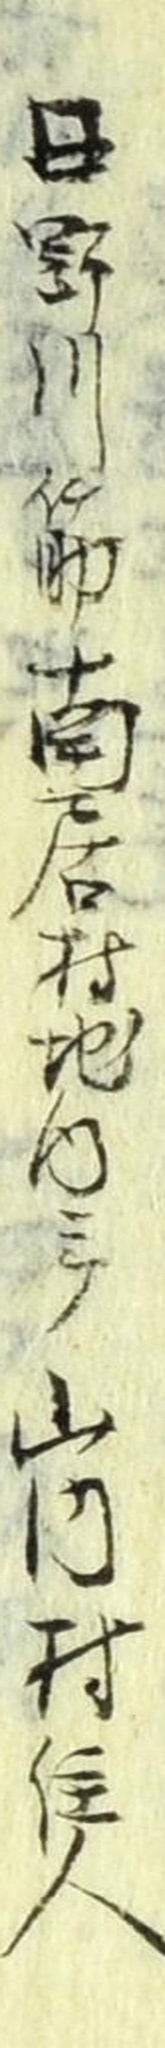日野川筋南居村地内にて山内村住人
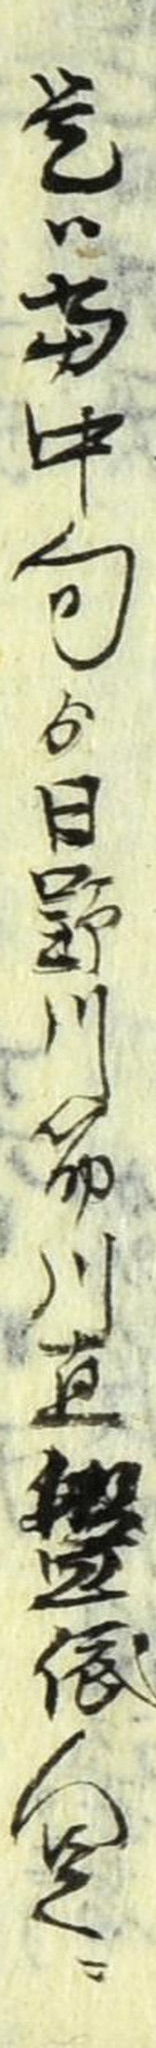是は当中旬ゟ日野川筋川直盤依人足に
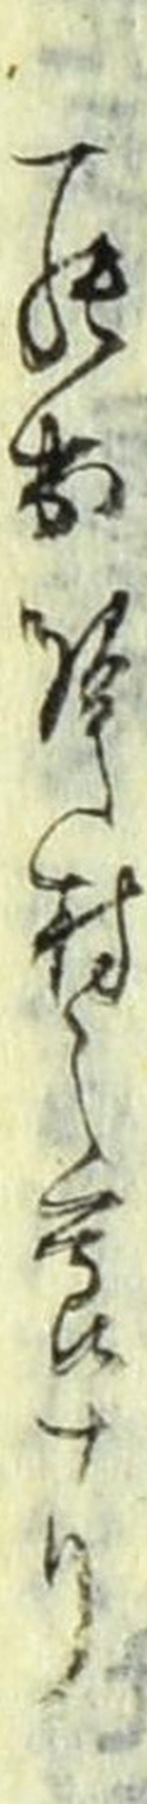罷出帰村之節なり

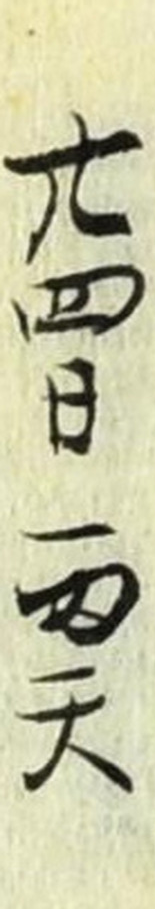廿四日雨天
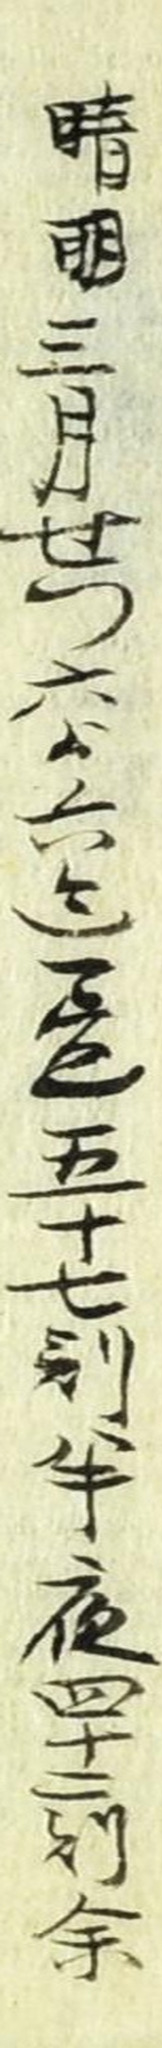晴明三月せつ六ゟ六迄昼五十七刻半夜四十二刻余
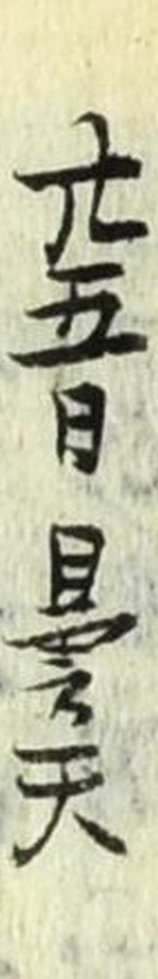廿四日雨天
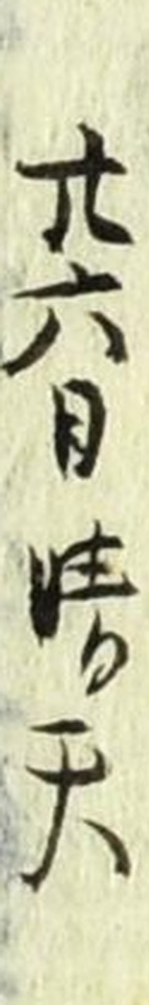廿四日雨天
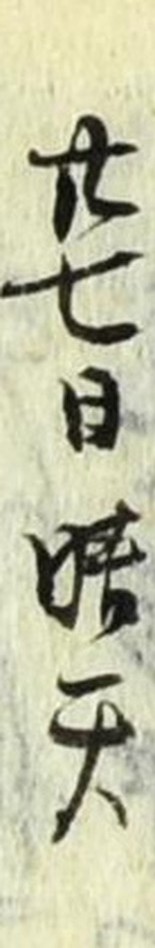廿四日雨天
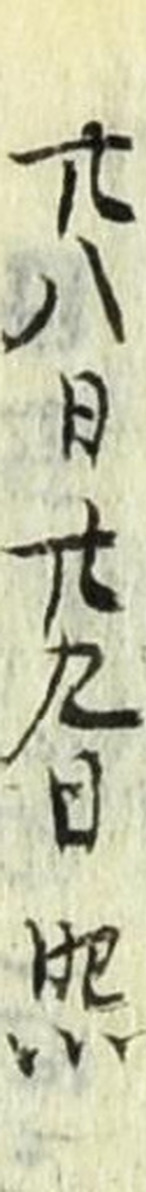廿八日廿九日照
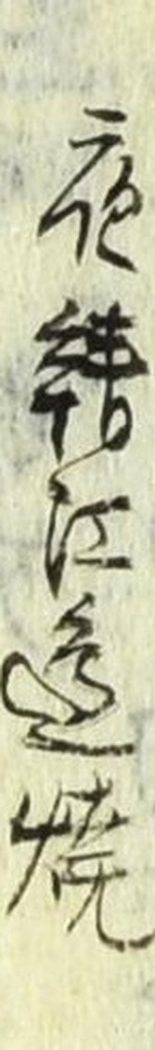夜鯖江辺焼
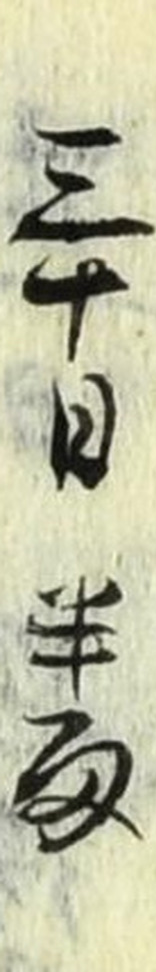三十日半雨
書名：（日記）
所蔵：福井県文書館 Fukui Prefectural Archives
